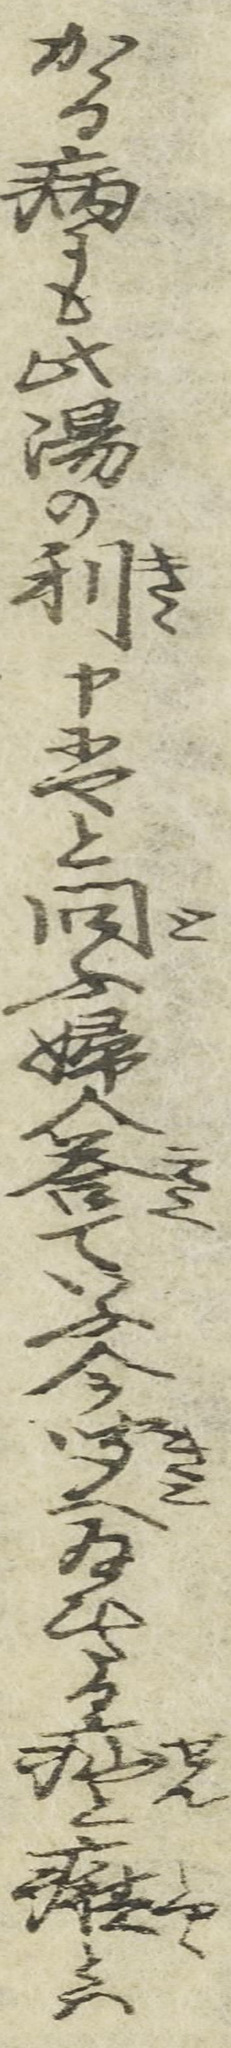かゝる病にも此湯の利申にやと問ふ婦人答ていふ今聞へ給ひける疝と癪とは
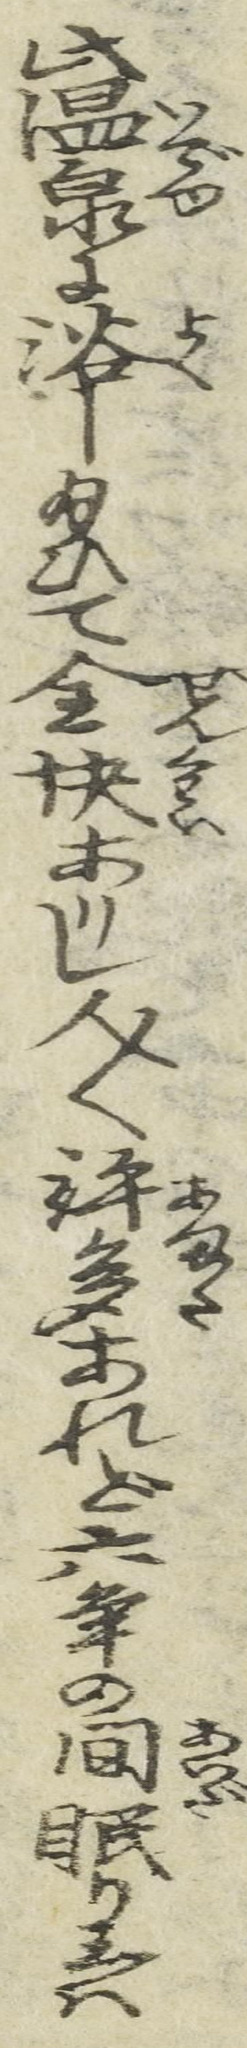此温泉に浴し給ひて全快ありし人〱許多あれど六年の間眠り玉は
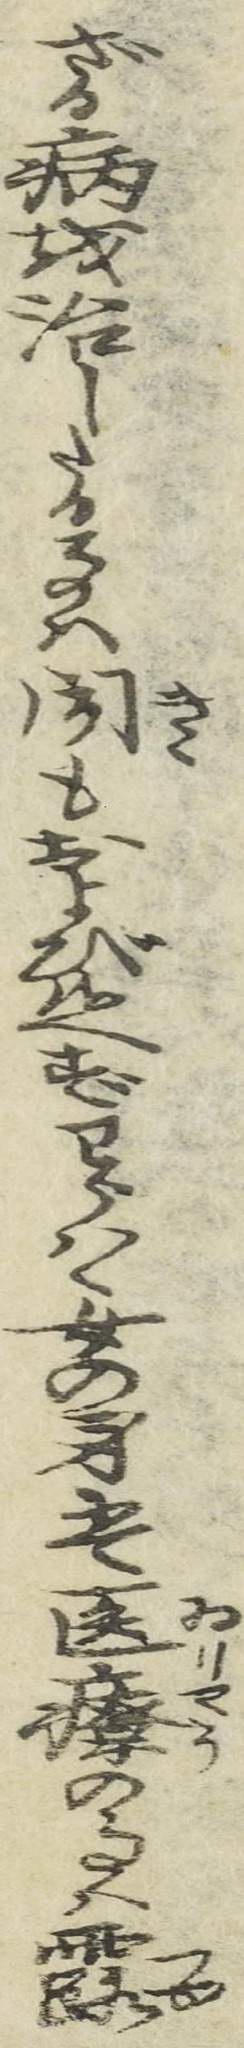ざる病を治したる事は聞もおよびあへずわらはゝ女の身にて医療の事は露
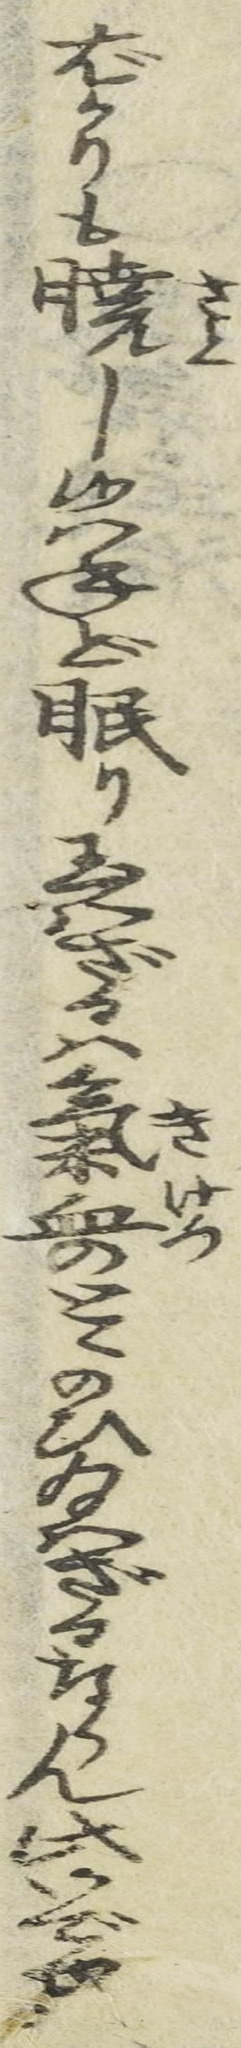ばかりも暁し給はねど眠り玉はざるは気血のとゝのひ給はざるならん此いでゆ
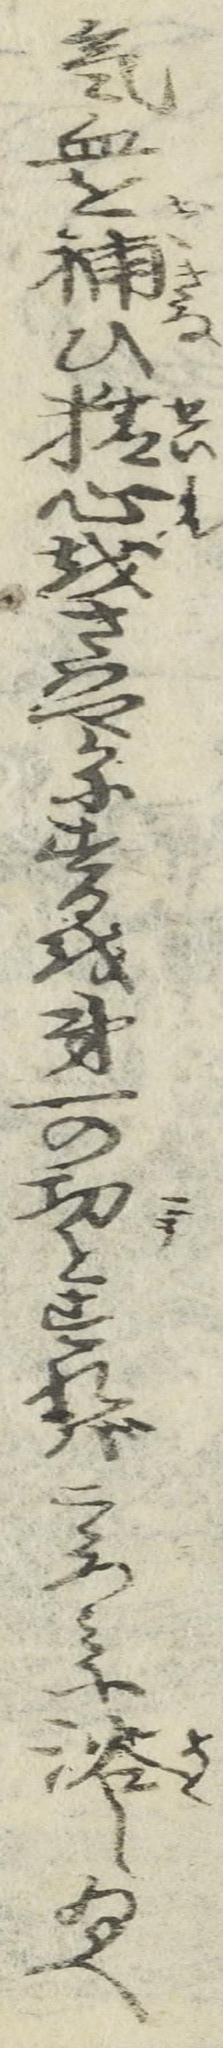気血を補ひ精心をさはやかにするを第一の功とすればこゝろみに浴し給へ
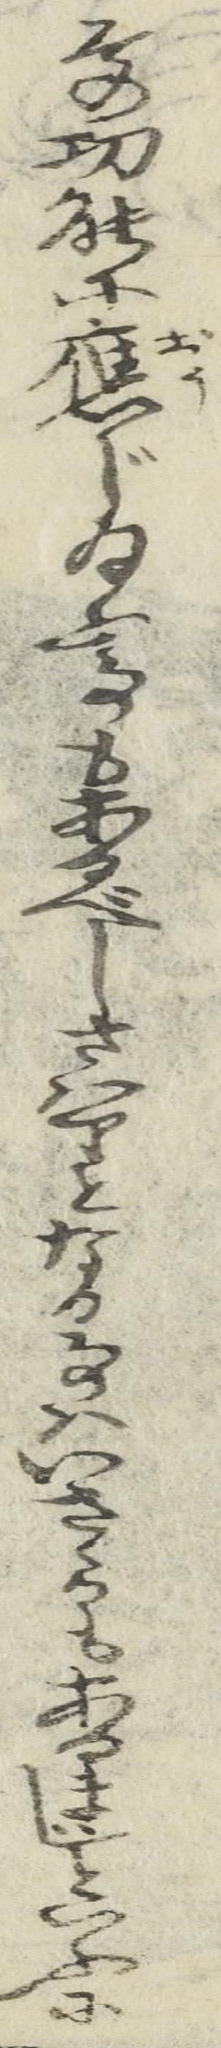その功能に応じ給ふ事もあるべしさはりとなる事はいさゝかもあるまじといふに
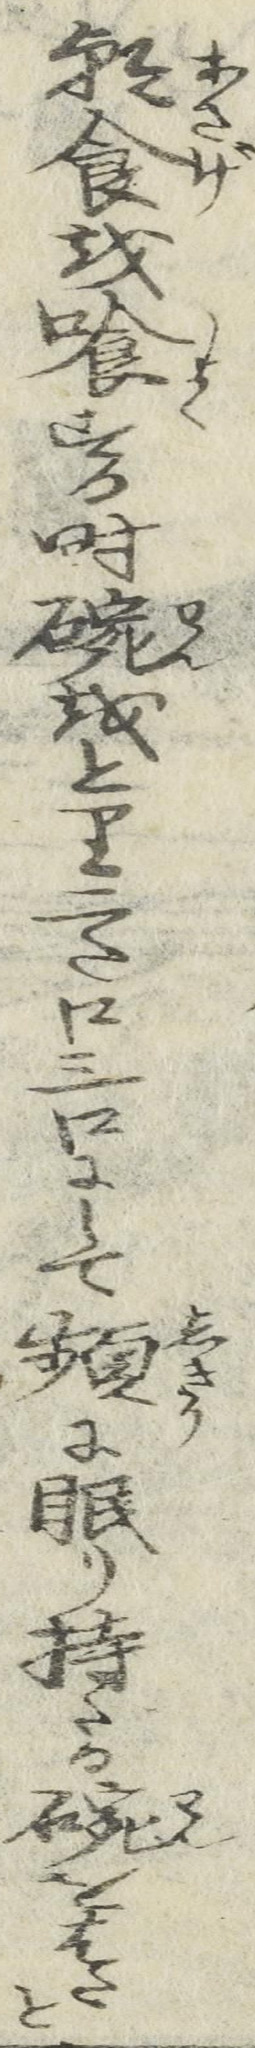朝食を喰する時碗をとり二た口三口にして頻に眠り持たる碗をはたと
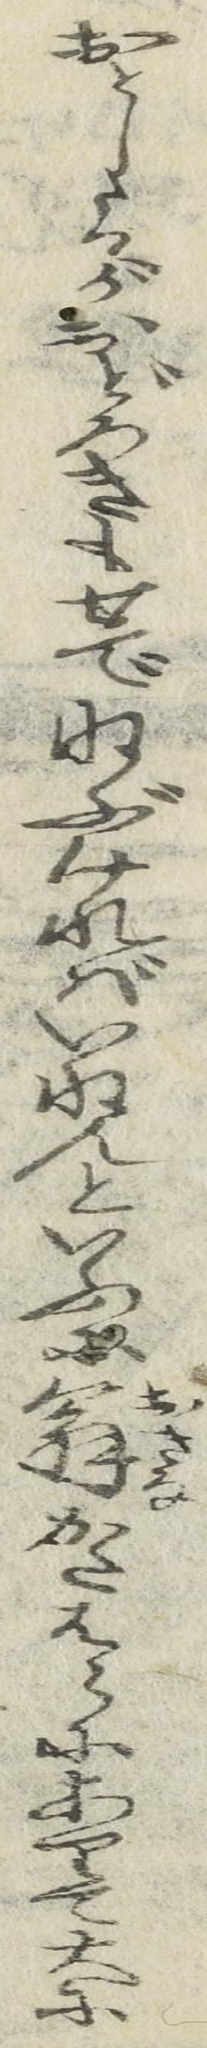おとしたるがおどろきもせでねぶければいねんといふに翁かたはらにありて大に
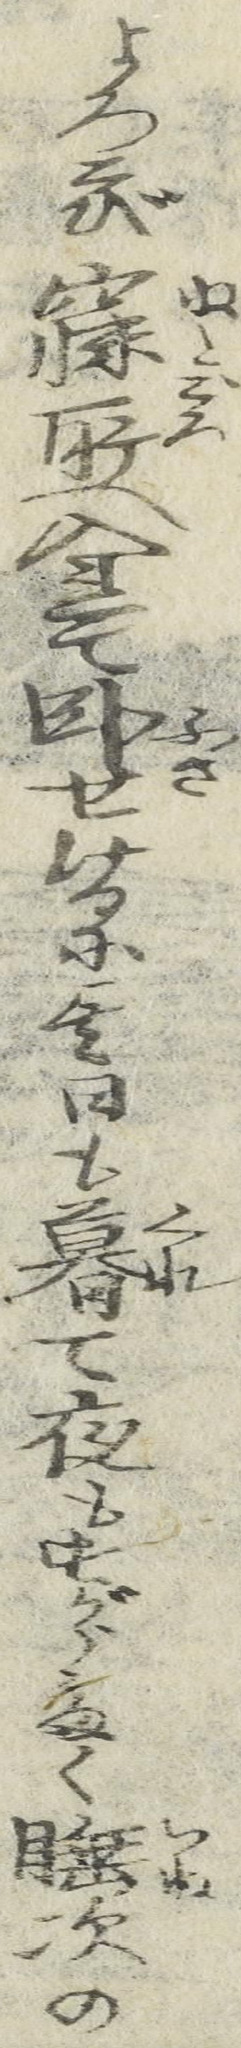よろこび寝所へ入れて臥せけるに其日も暮て夜もすがらうまく睡次の
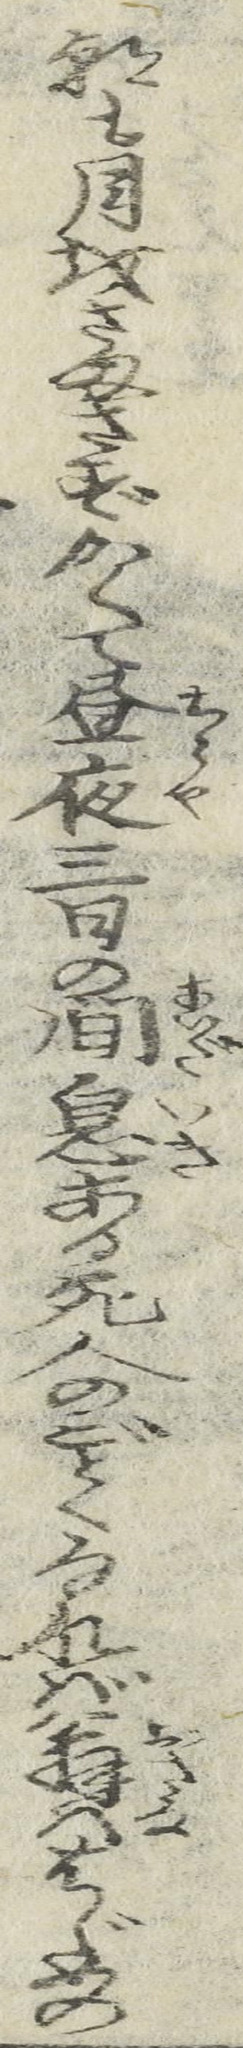朝も目をさまさずかくて昼夜三日の間息ある死人のごとくなれば翁ははじめの
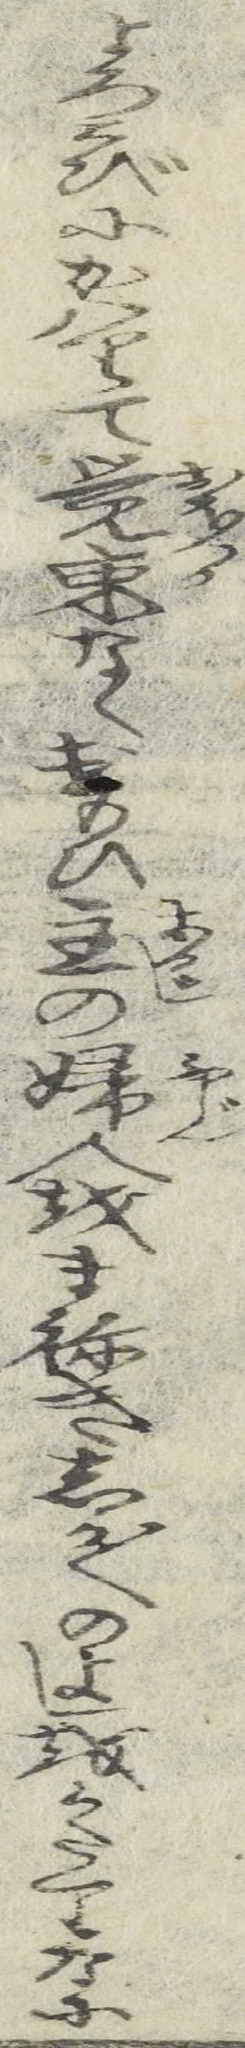よろこびにかはりて覚束なくおもひ主の婦人をまねきしか〳〵のよしをかたりなに
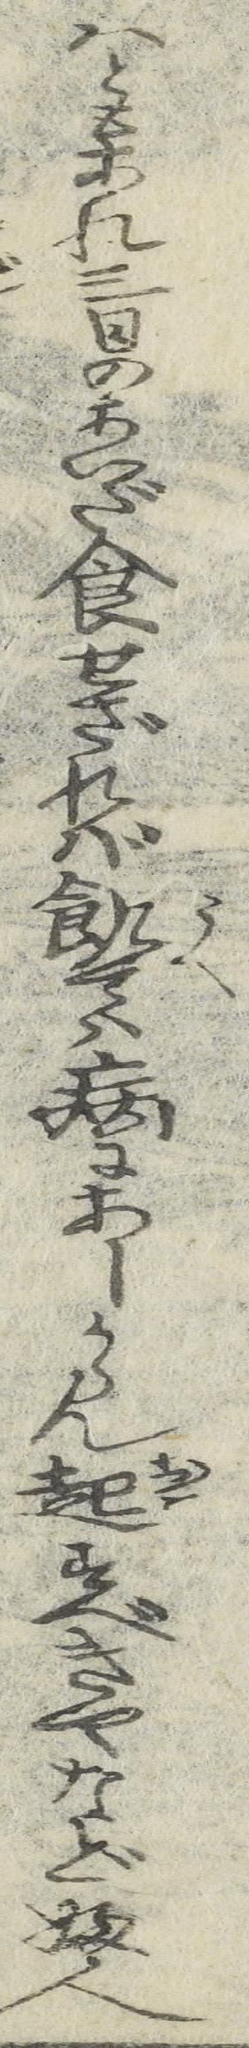はともあれ三日のあいだ食せざれば飢ては病にあしからん起すべきやなど婦人
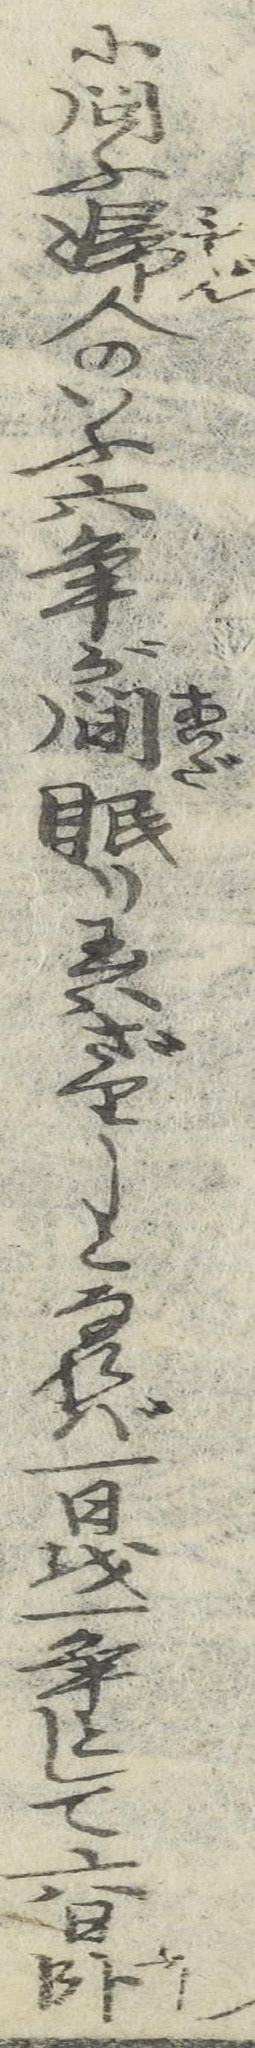に問ふ婦人のいふ六年が間眠り玉はざりしとなれば一日を一年として六日臥
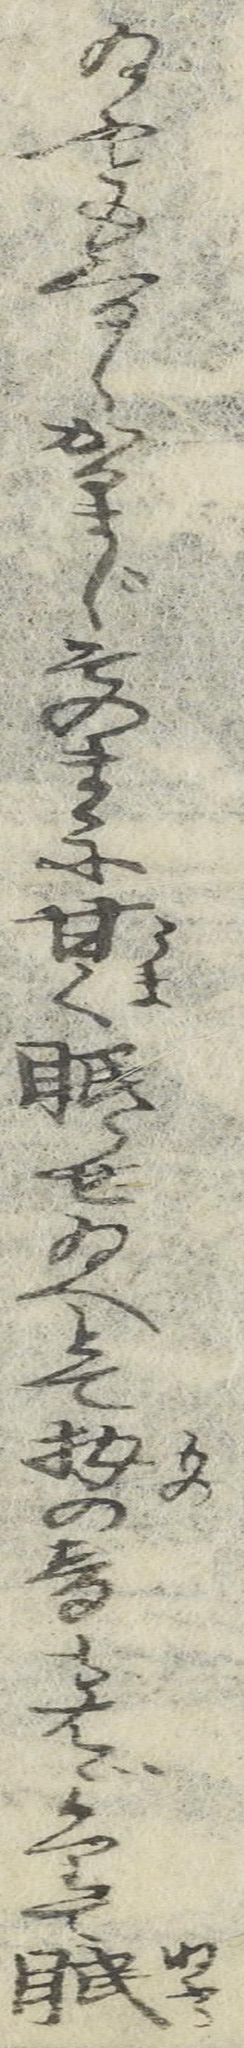給ふともくるしかるまじそのまゝに甘く眠らせ給へとて物の音もはゞかりて眠

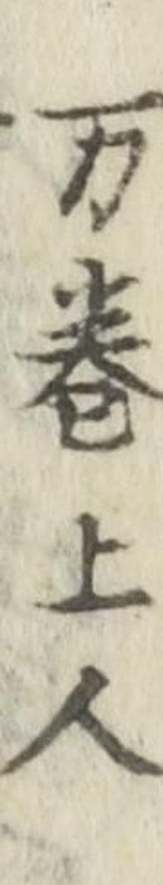万巻上人
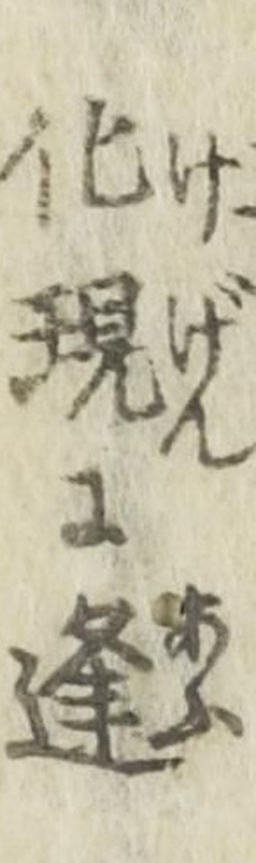化現に逢
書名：熱海温泉圖彙
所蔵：東京大学地震研究所図書室 Earthquake Research Institute Library, The University of Tokyo, JAPAN
